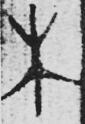木
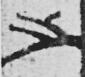之
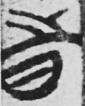○（時）
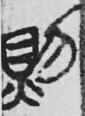則（則）
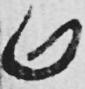㠯（以）
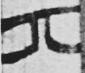亓（其）
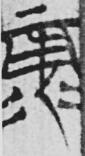彔（祿）
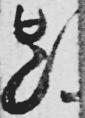也
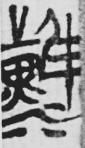灘（漢）
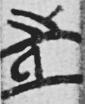○（廣）
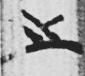之
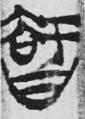智（知）
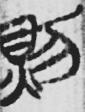則（則）
